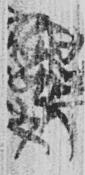○（喪）
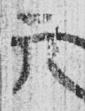亓
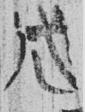佖（匹）
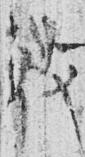敓（奪）
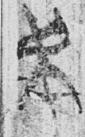民
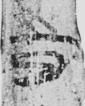○（時）
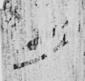㠯（以）
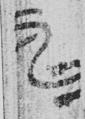水
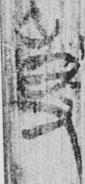事
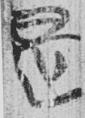是
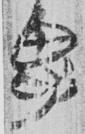{胃刀}（謂）
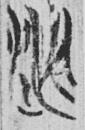淵（渊）
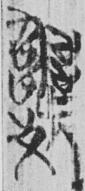○（喪）
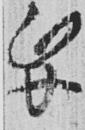○（怠）
